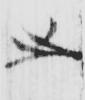之
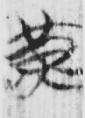黃
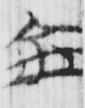金
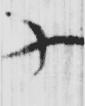七
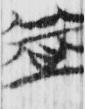益
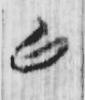㠯（以）
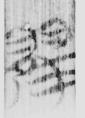翟（糴）
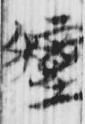穜（種）
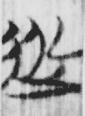迄
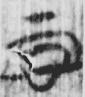○（期）
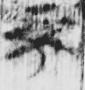不
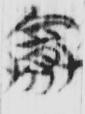賽
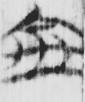金
